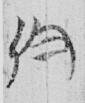於
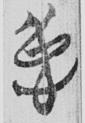○（仁）
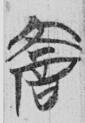○（顔）
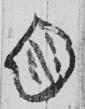囦（淵）
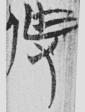拃（作）
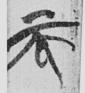而
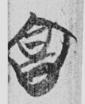○（答）
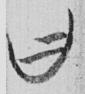曰
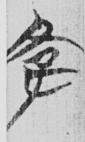韋（回）
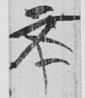不
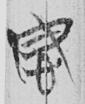○（敏）
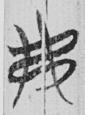弗
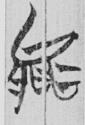能
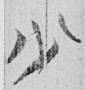少
